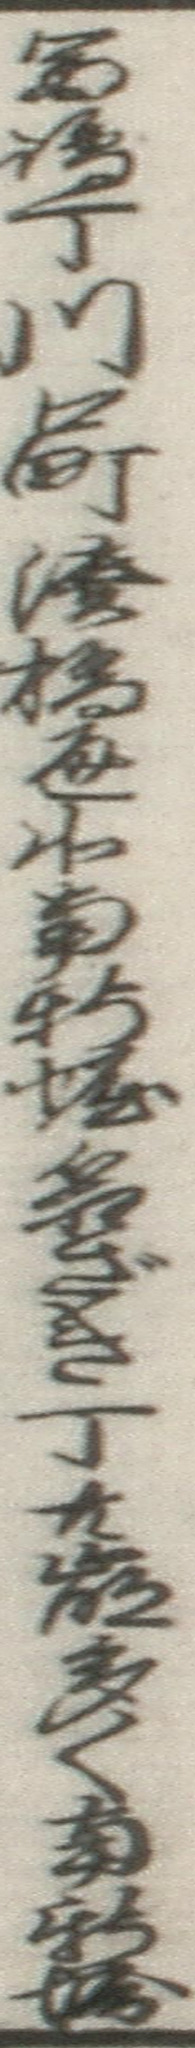富嶋丁川口町湊橋通北南新堀箱ざき丁共崩多く南新堀

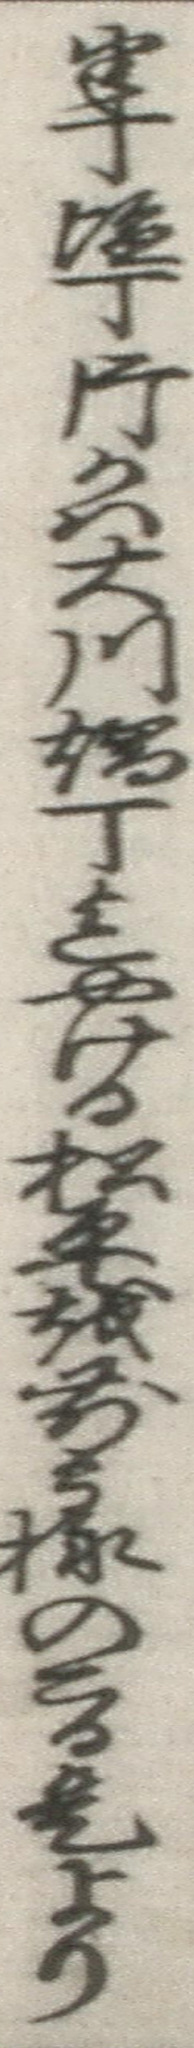半丁塩丁片かは大川端丁迄やける松平越前守様のこる是より
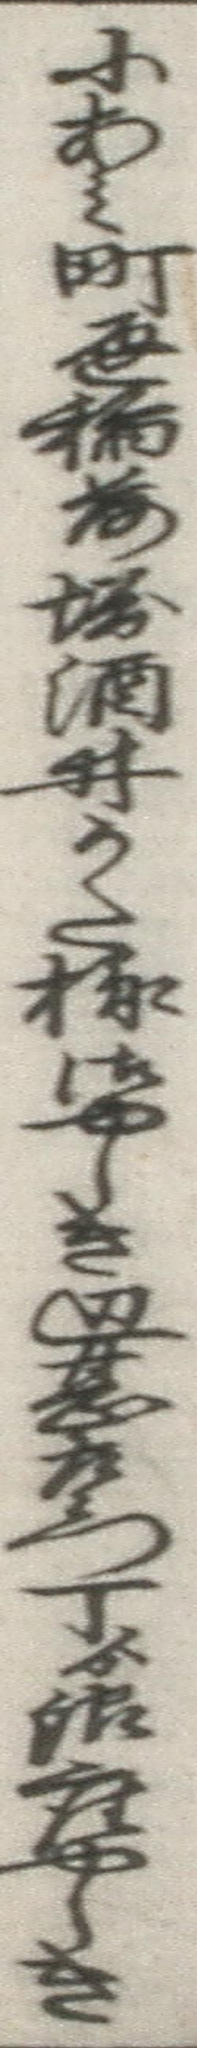小あみ町通り稲荷堀酒井うた様御やしき辺甚左衛門丁ゟ銀座やしき
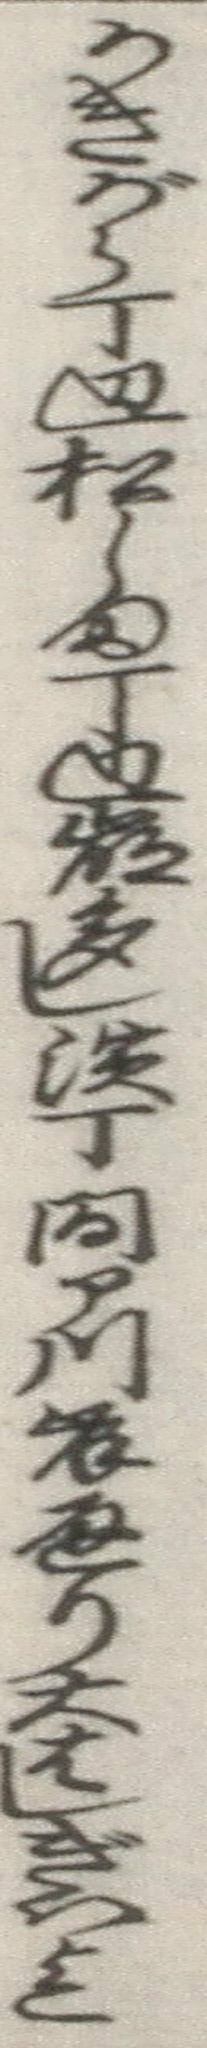かきがら丁辺松しま丁辺崩れ多し濱丁間部川岸通り大はしぎは迄
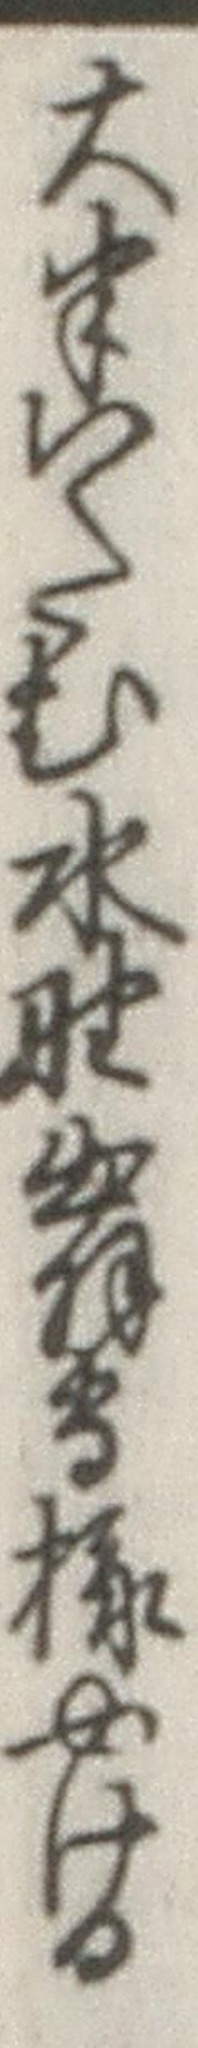大半いたむ水野出羽守様やける
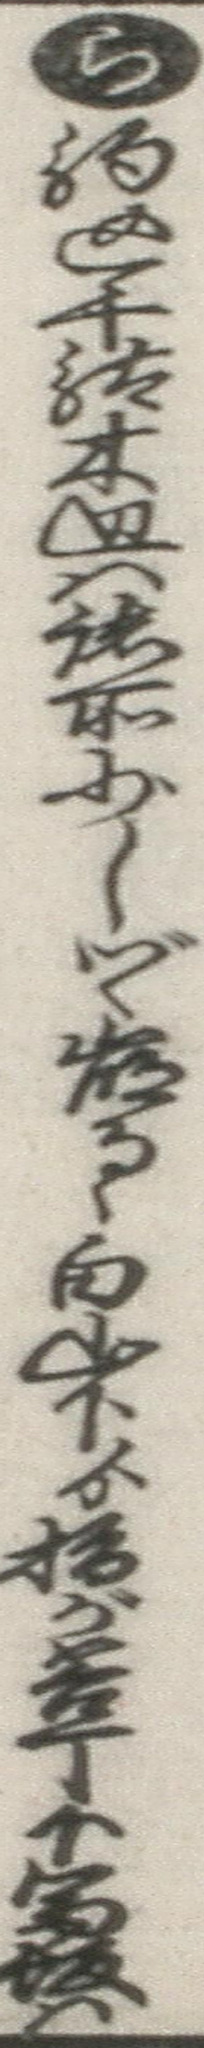ら駒込千駄木辺は諸所少しヅヽ崩るゝ白山下ゟ指が谷丁下富坂は
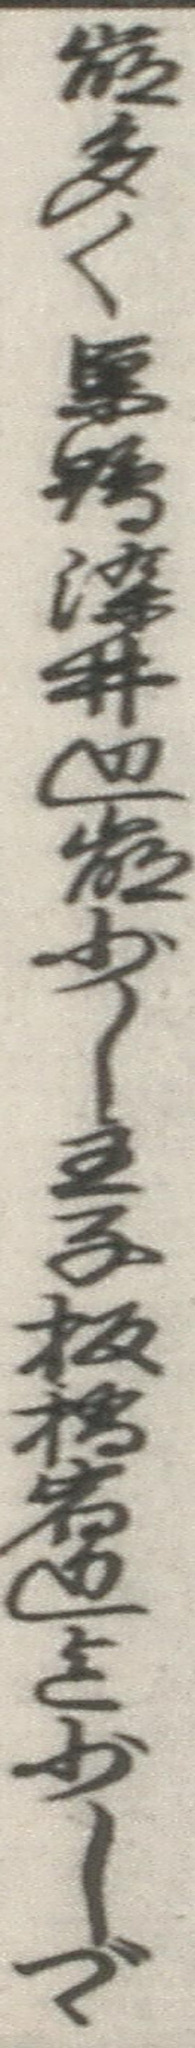崩多く巣鴨染井辺崩少し王子板橋宿辺迄少しづゝ
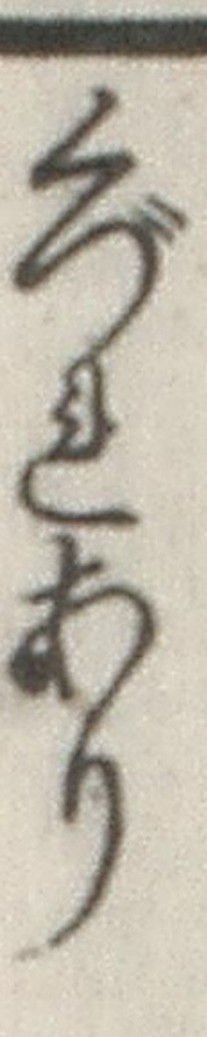くづれあり
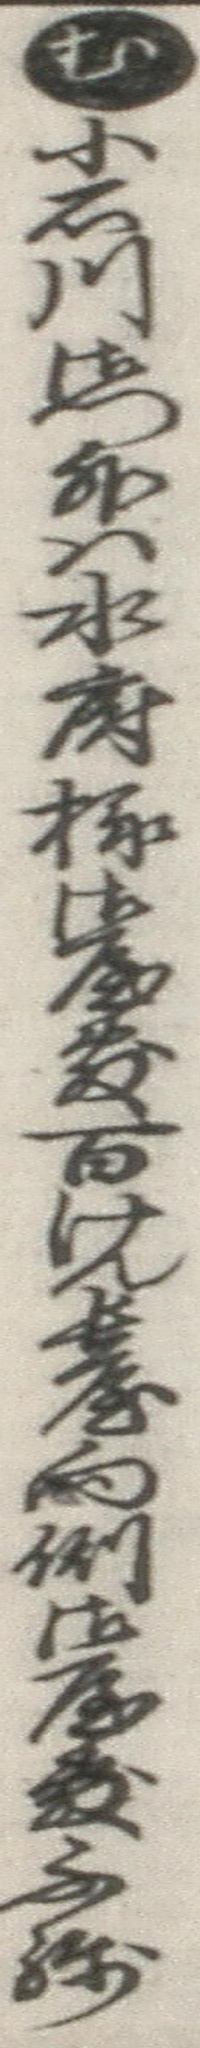む小石川御門外は水府様御屋敷百けん長屋向側御屋敷不残
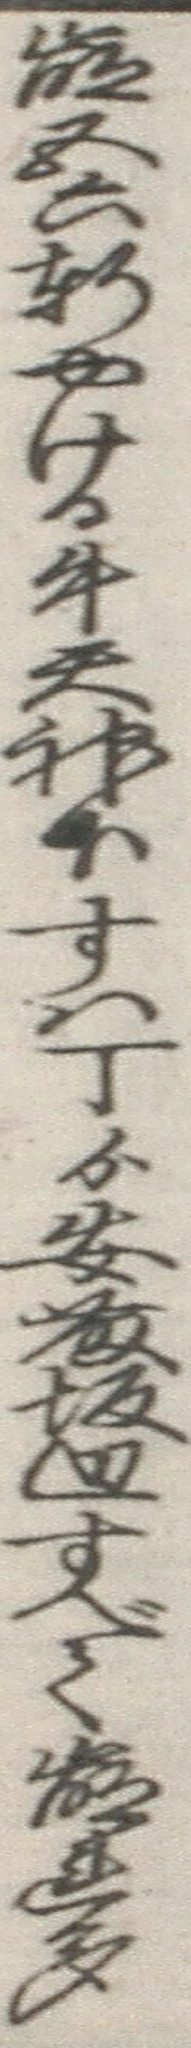崩五六軒やける牛天神下すは丁ゟ安藤坂辺すべて崩れ多
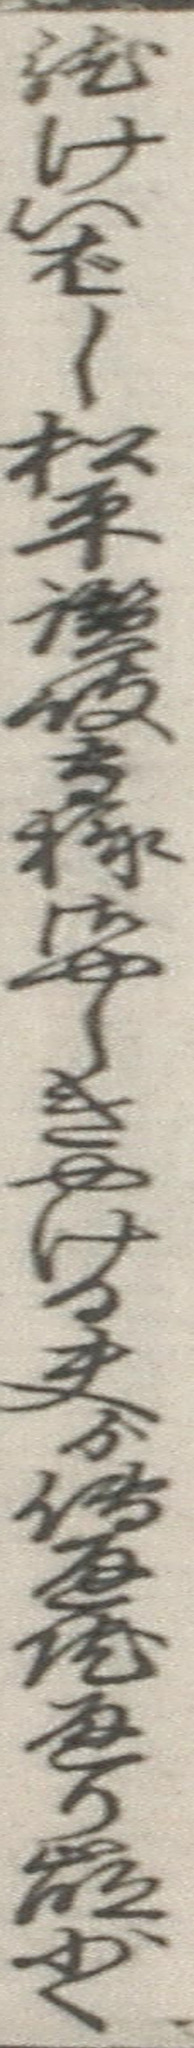龍けいばし松平讃岐守様御やしきやける夫ゟ傳通院通り崩少く
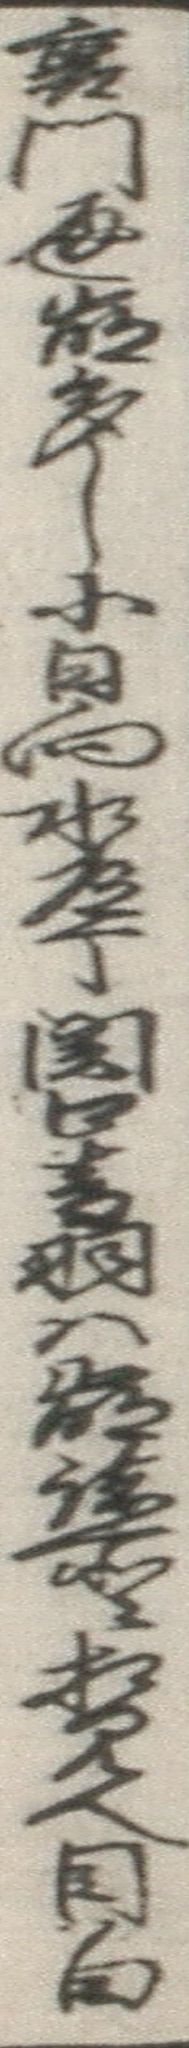裏門通崩多し小日向水道丁関口音羽は崩諸所に相見へ目白
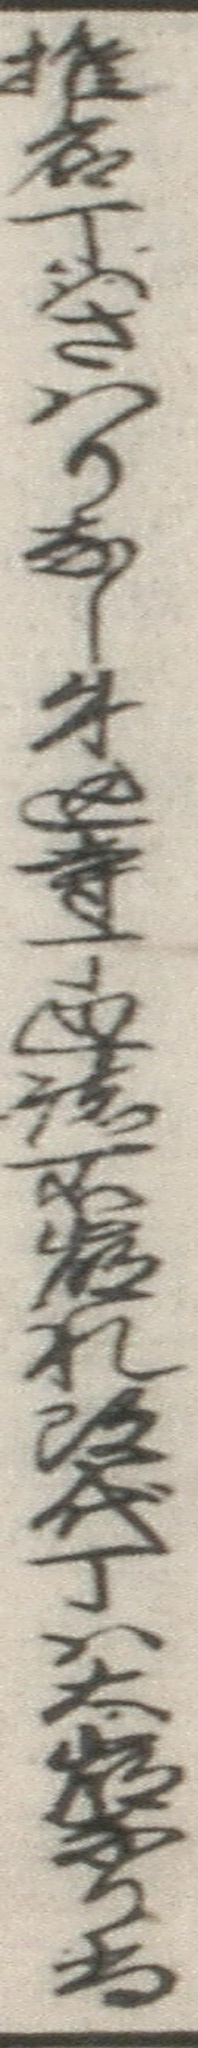椎名丁はさはりなし牛込寺丁辺諸所崩れ改代丁は大崩なり尚
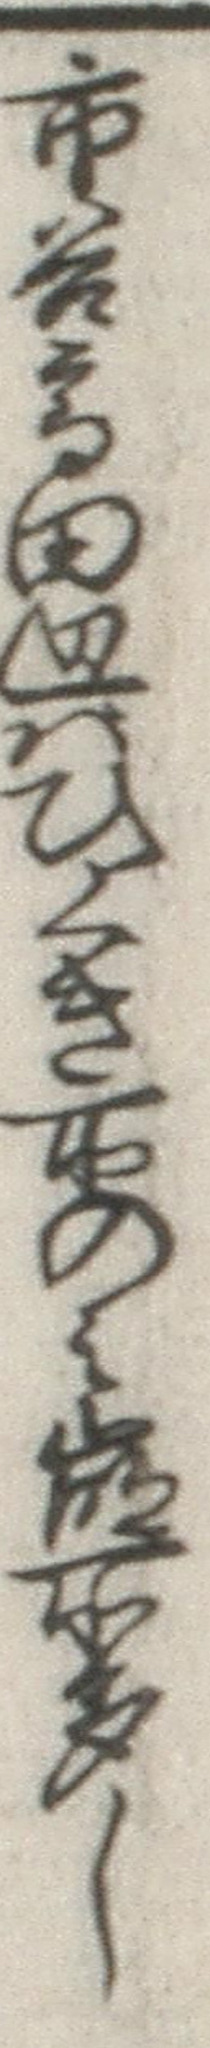市谷高田辺はひくき所のみ崩所多し
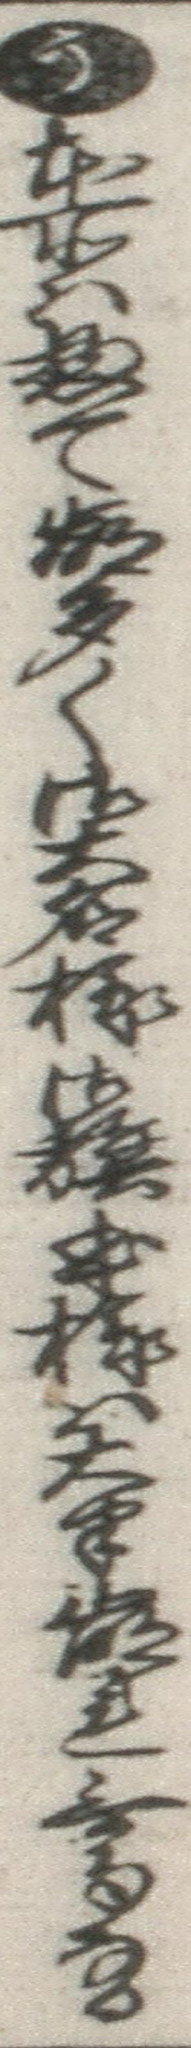う本所は惣て崩多く御大名様御旗本様は大半崩れ無事なる
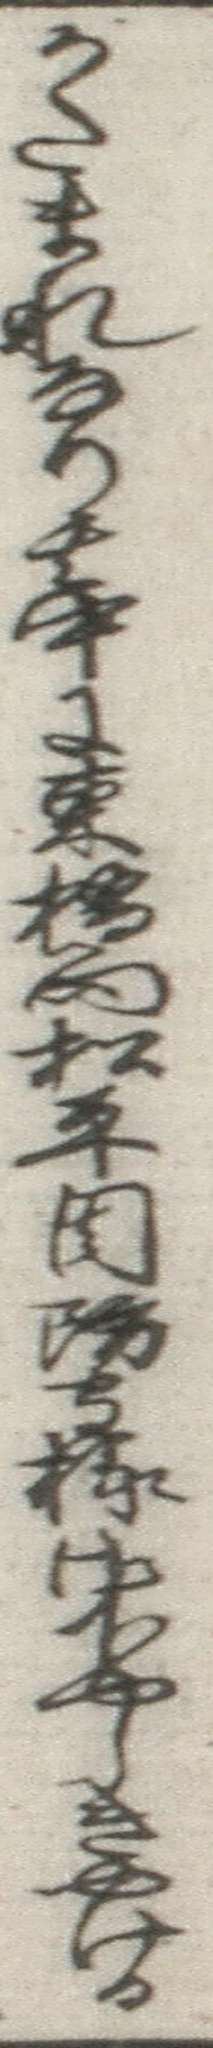かたまれなり其中に東橋向松平周防守様御下やしきやける
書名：大地震焼場細見記
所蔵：東京大学地震研究所図書室 Earthquake Research Institute Library, The University of Tokyo, JAPAN
